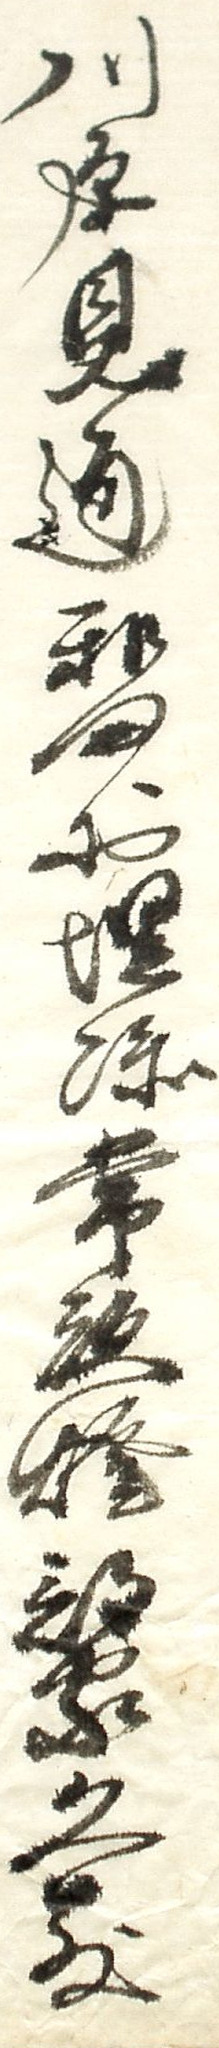川原見通和田村堤添常夜燈部家久敷
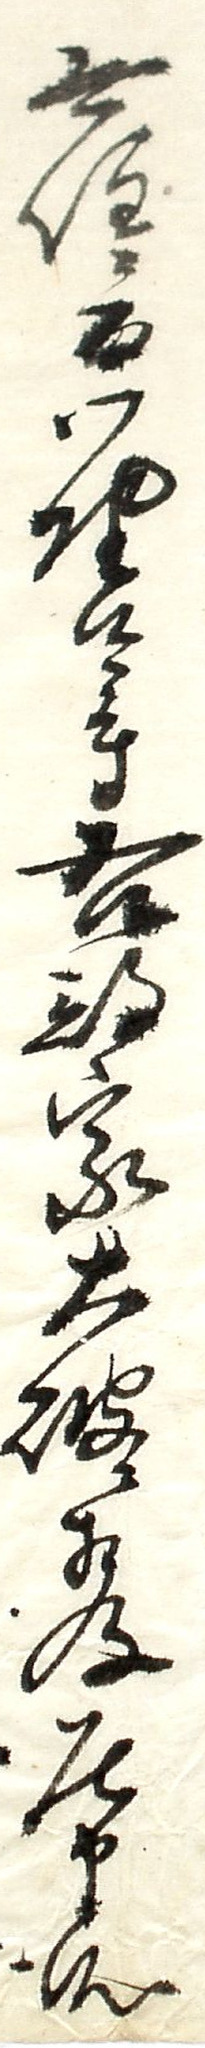無住ニ而御坐候ニ付右部家大破ニ相及居申所
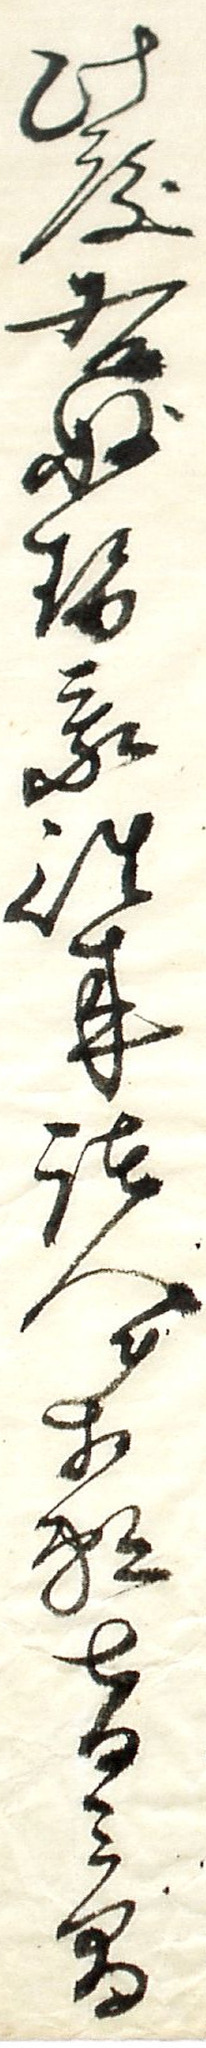此度右妙勢義往来諸人ヲ相願七日之間
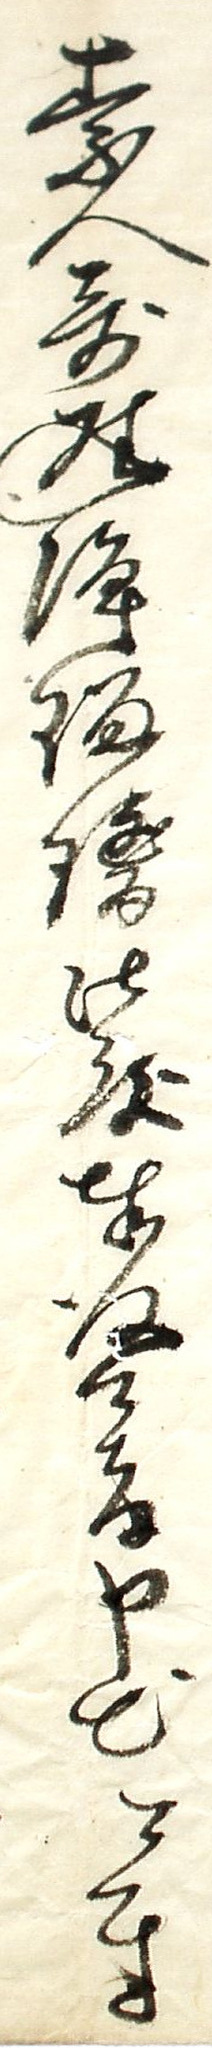素人寄進浄瑠璃仕度奉存候旨申出ニ付
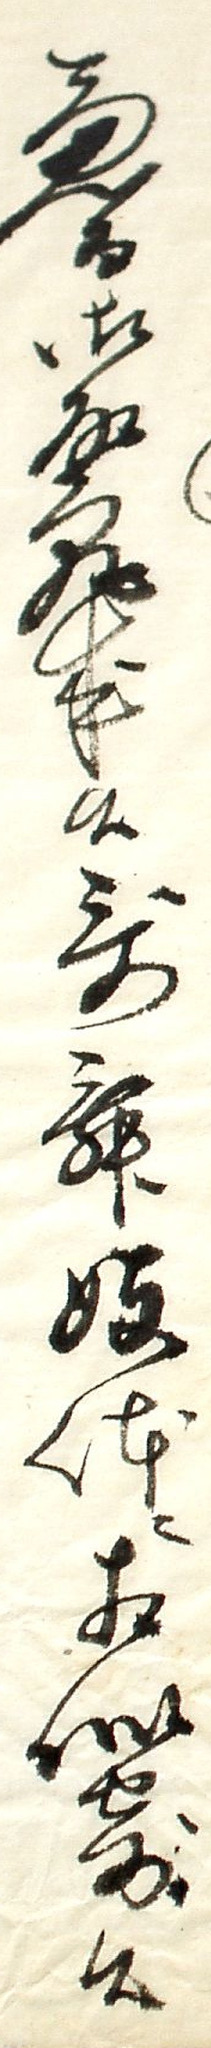兼而御取究成候哥舞妓体ニ相似寄候
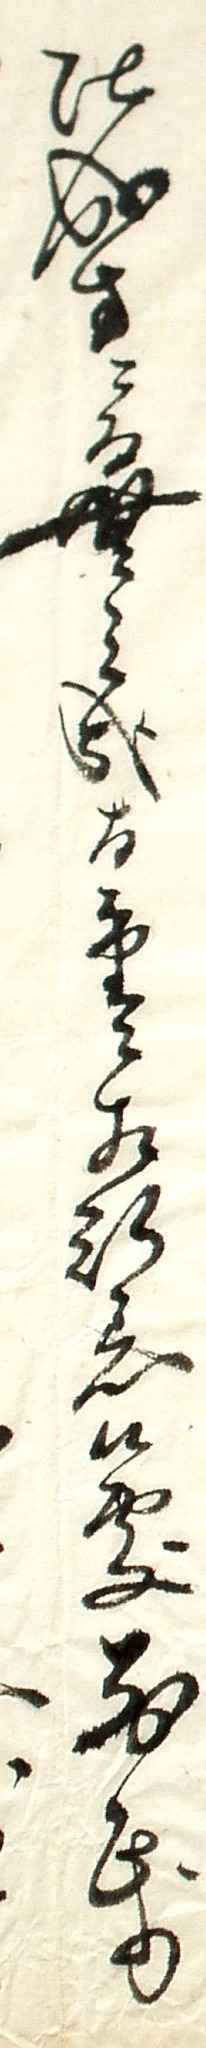仕成方ニ而無之哉と重々相行着候處別帋
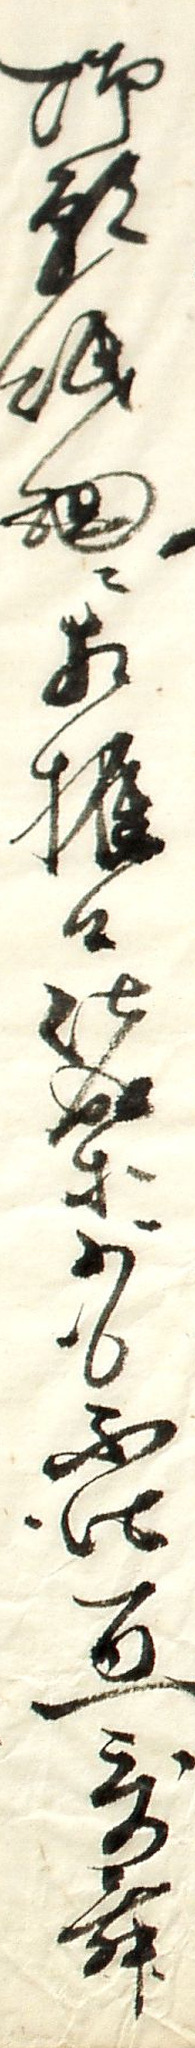御願紙面ニ相振候仕成等少も不仕万一哥舞
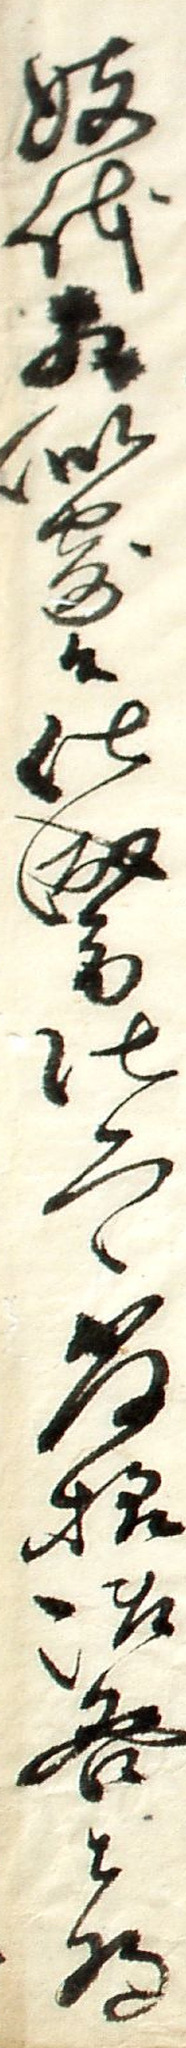妓体相似寄候仕成方仕候ハヽ如何様御咎被為
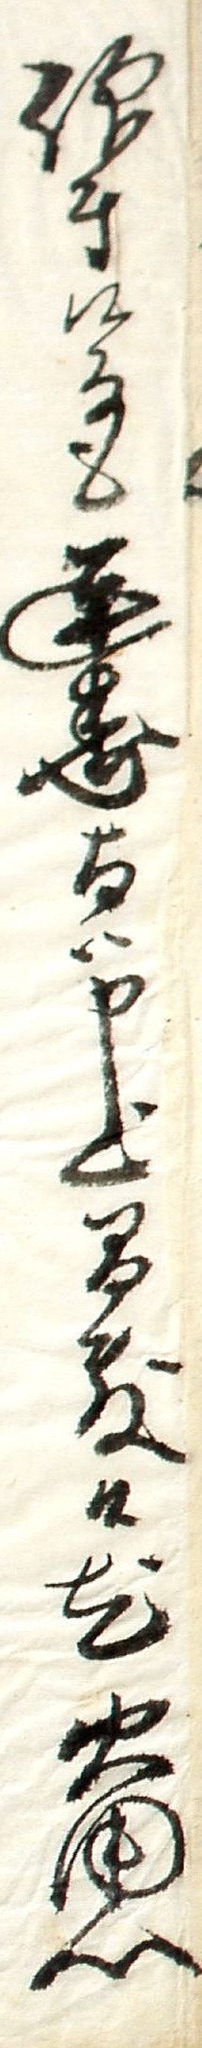仰付候而も迷惑とハ申上間敷候尤火用心
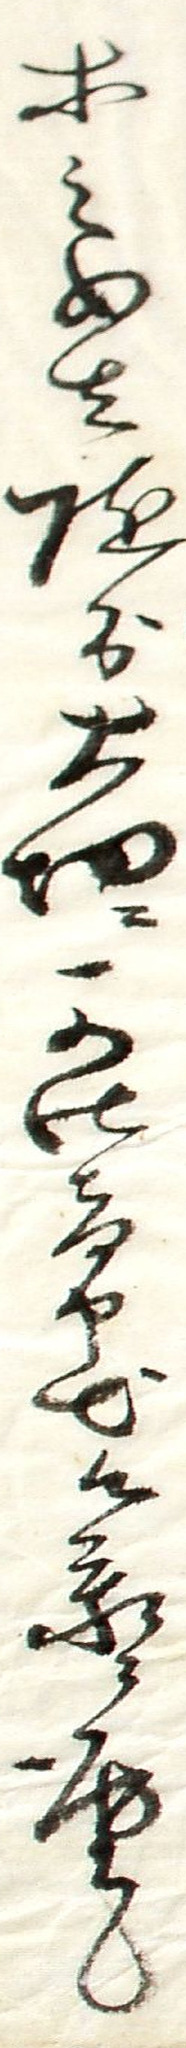等之義者随分大切ニ可仕旨申出候義ニ御坐候
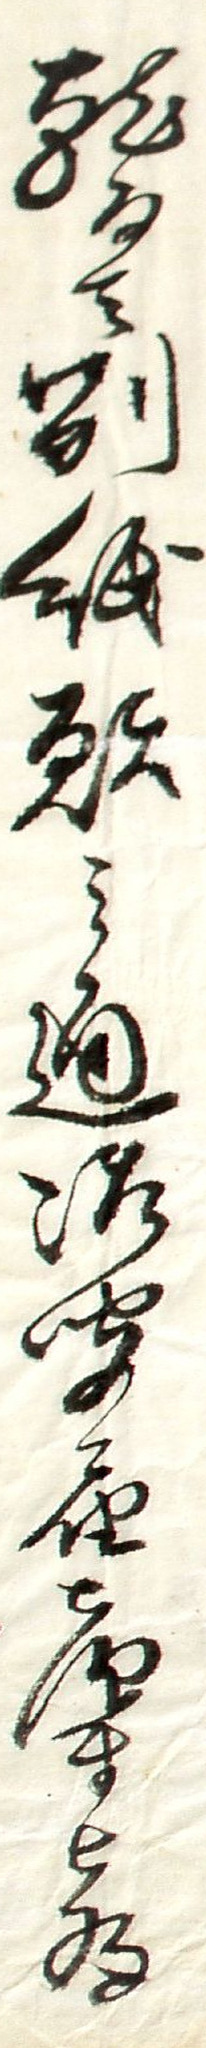就而者別紙願之通御聞届被仰付被為
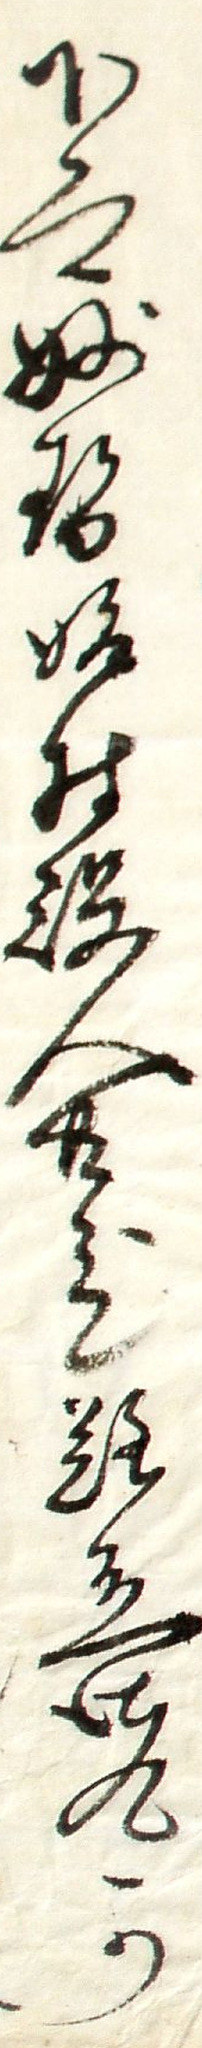下候ハヽ妙勢始村役人共迄難有仕合可

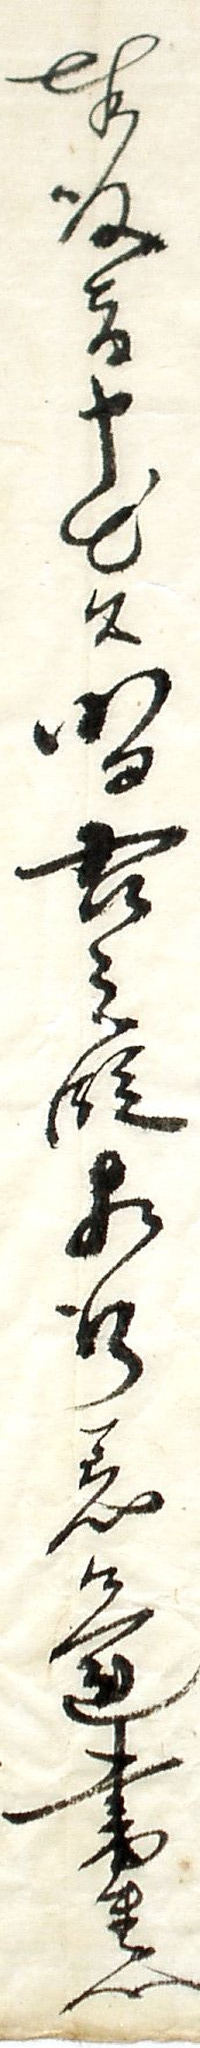奉存旨申出候仍而右之段相行着候運書付ヲ以
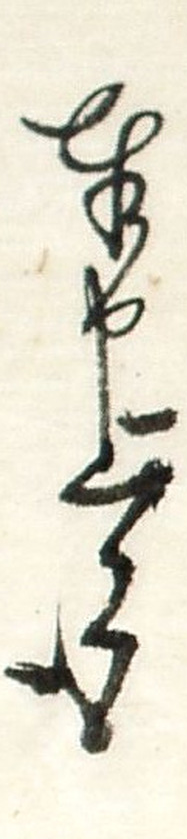奉申上候以上
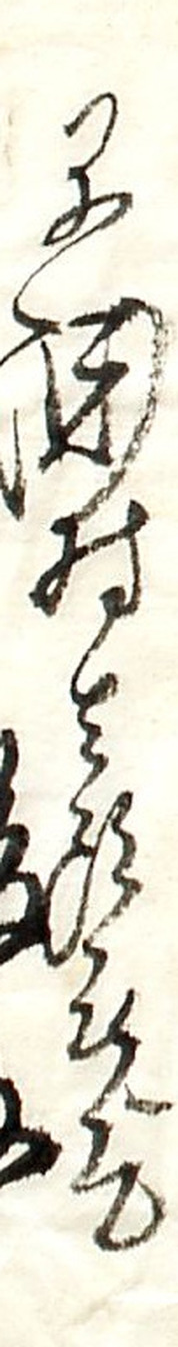早渕村与頭庄屋
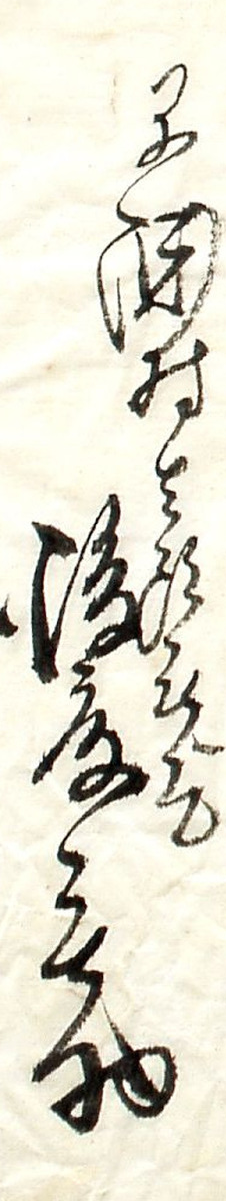早渕村与頭庄屋
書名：和田村常夜燈寄進浄瑠璃行着書控他
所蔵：鳴門教育大学 Naruto University of Education
